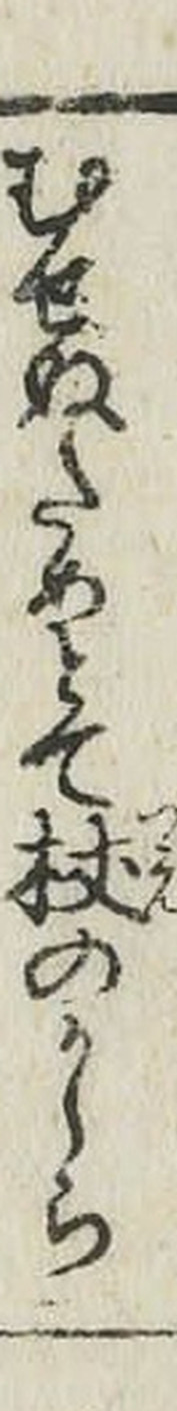むせぬためとて杖のかしら
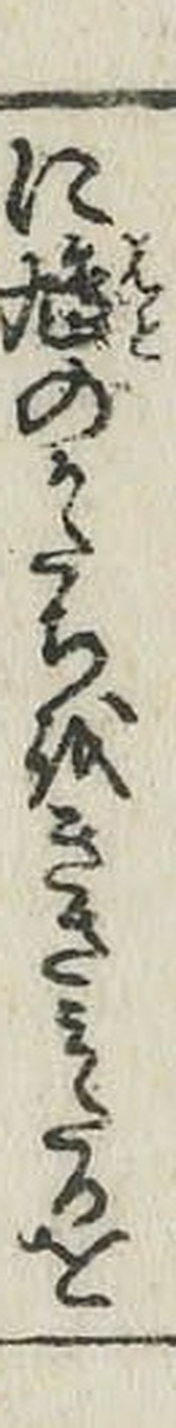に鳩のかたちをきさみたるを
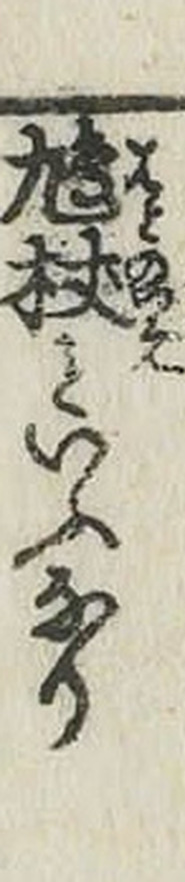鳩杖といふなり
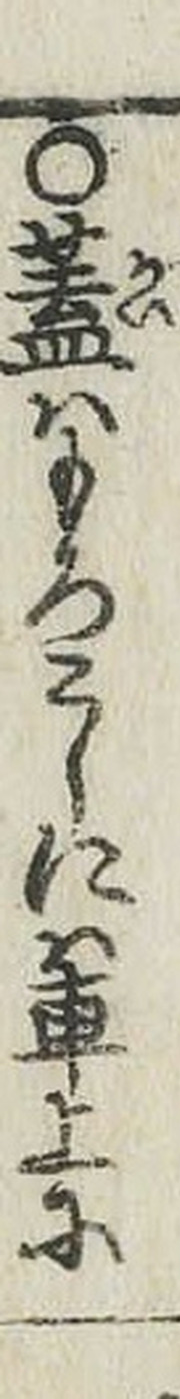○蓋はもろこしには車上に
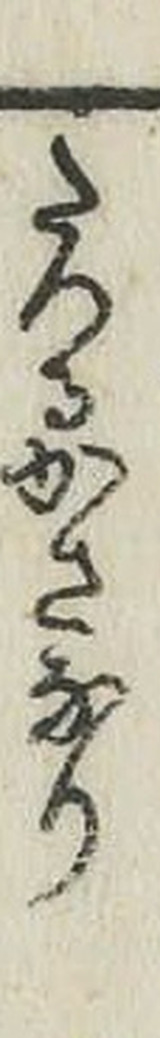たつるかさなり

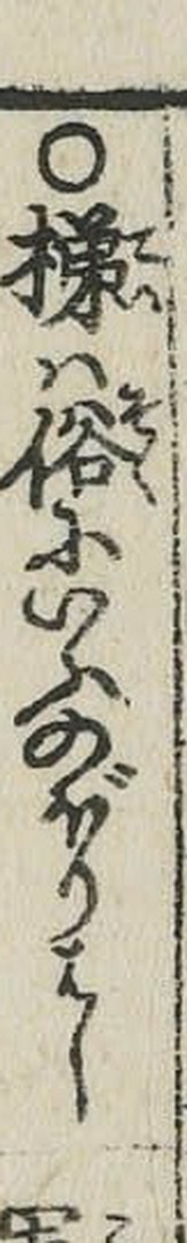○梯は俗にいふのぼりはし
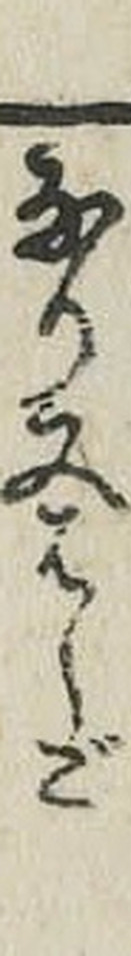なり又はしご
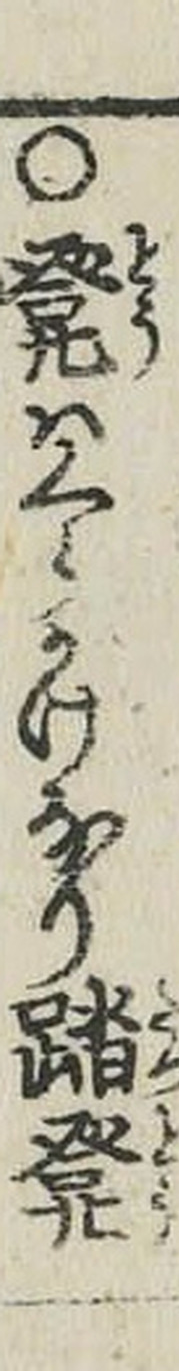○凳はくらかけなり踏凳
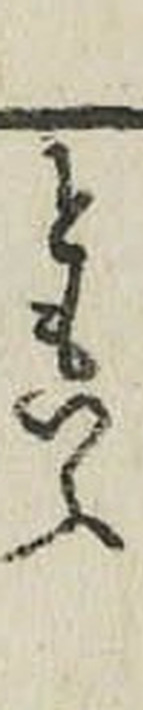ともいふ
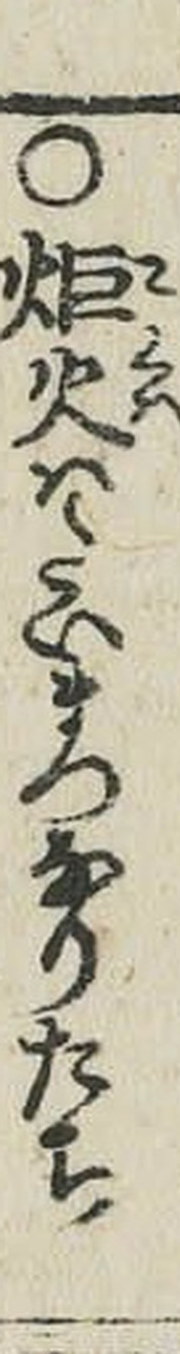○炬火はたいまつなりたち
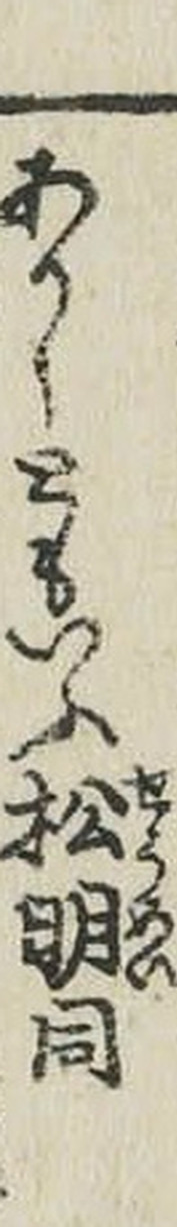あかしともいふ松明同
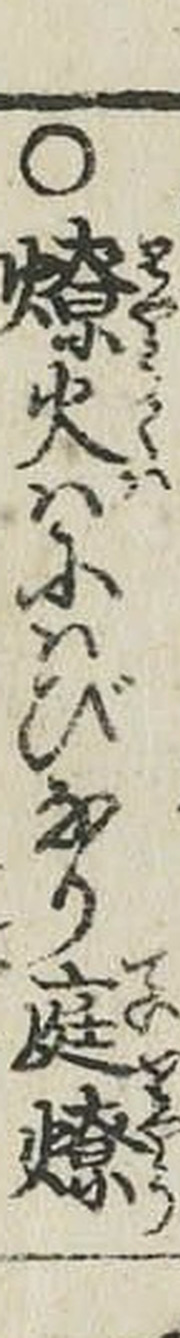○燎火はにはびなり庭燎
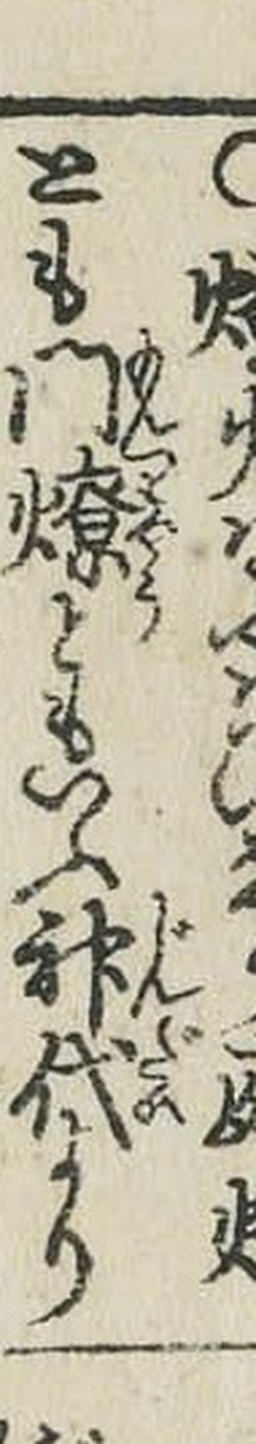とも門燎ともいふ神代より
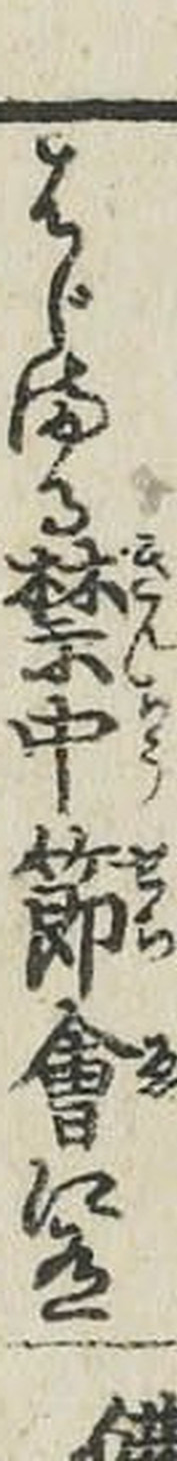はじまる禁中節会に有
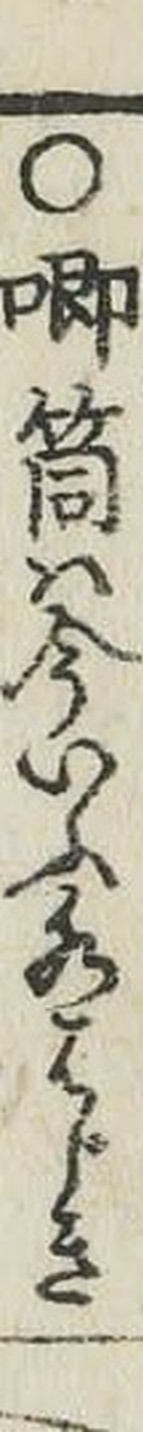○唧筒は今いふ水はじき
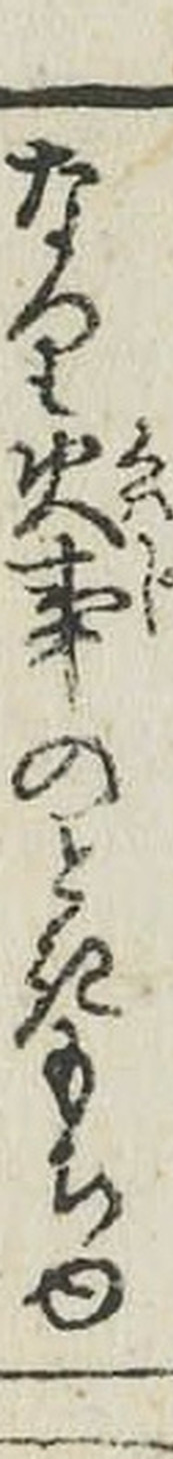なり火事のときもちゆ
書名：増補頭書訓蒙図彙大成 10巻 5:巻之9-11
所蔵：東京学芸大学教育コンテンツアーカイブ
